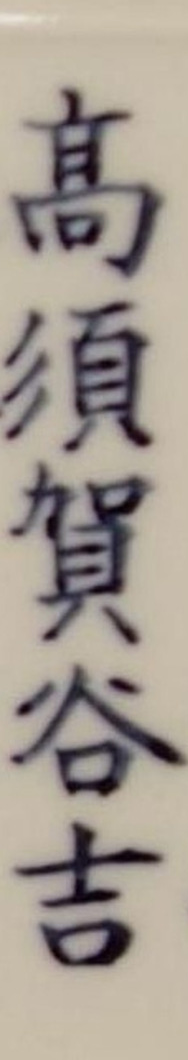高須賀谷吉
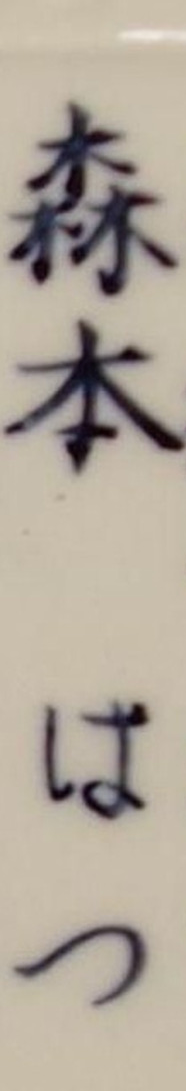森本はつ
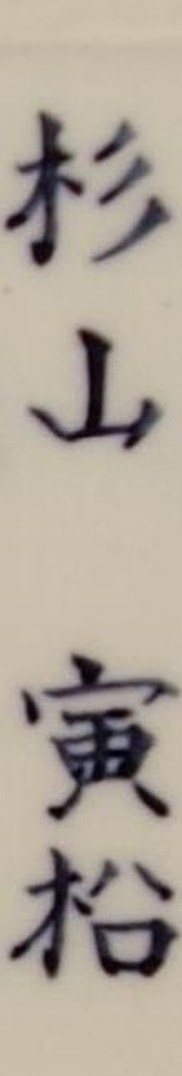杉山寅松
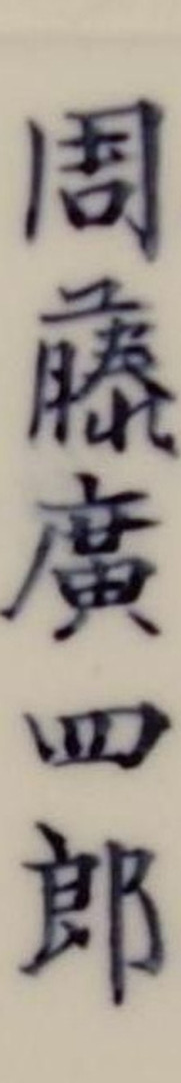周藤広四郎
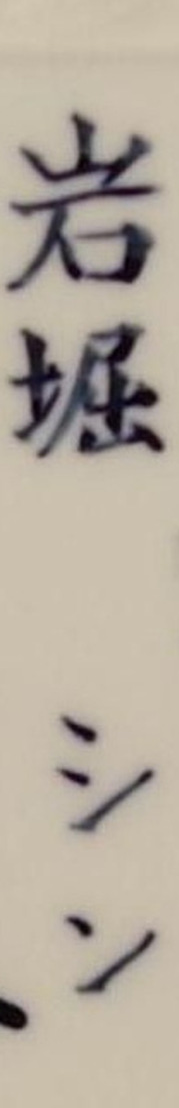岩堀シン
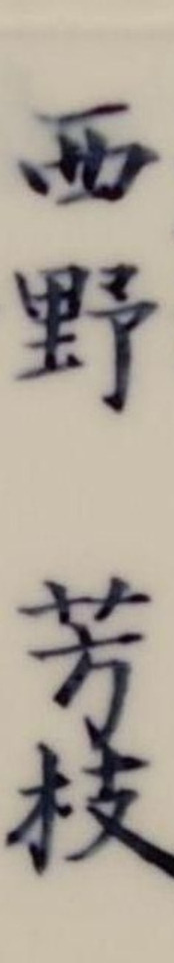西野芳枝
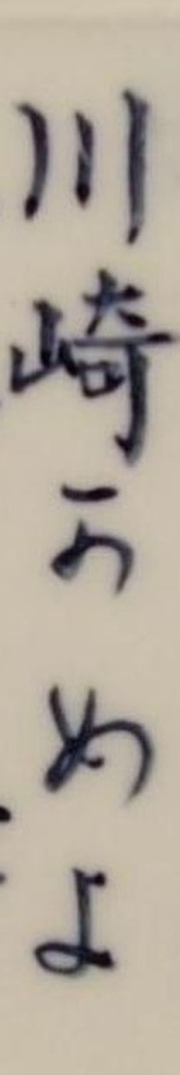川崎かめよ
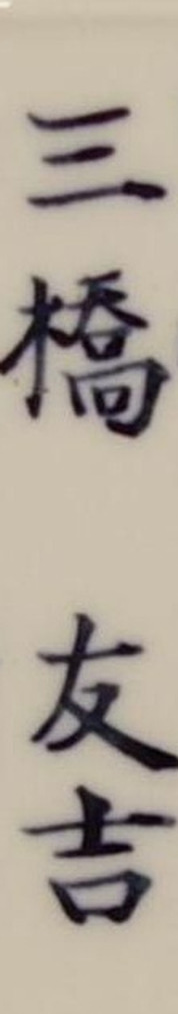三橋友吉
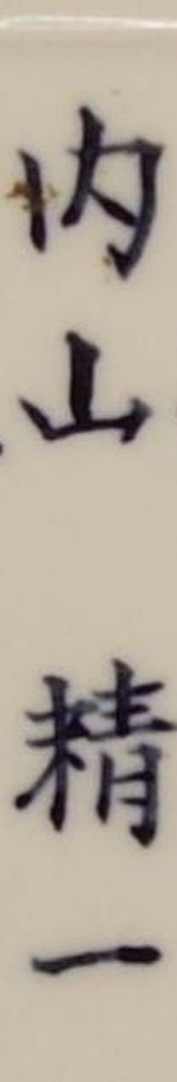内山精一
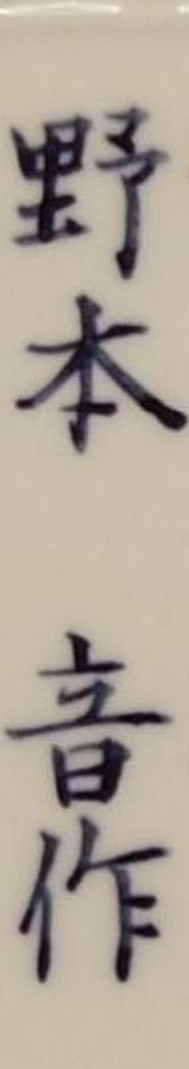野本音作
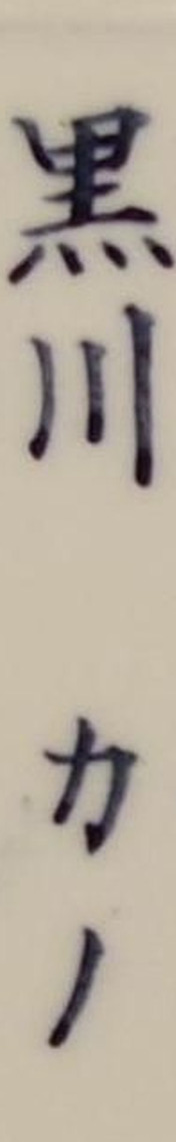黒川カノ
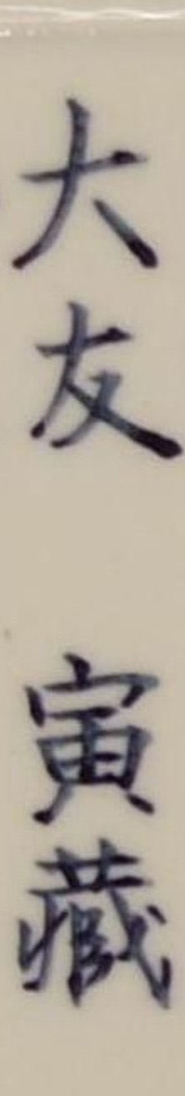大友寅蔵
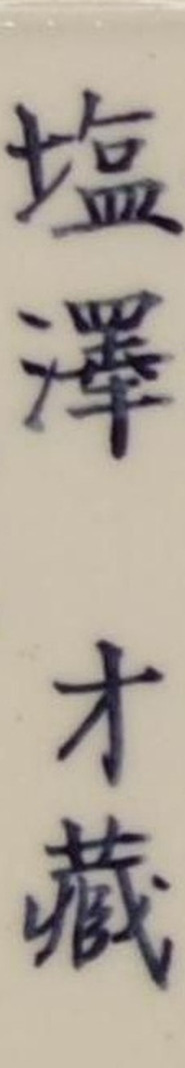塩澤才蔵
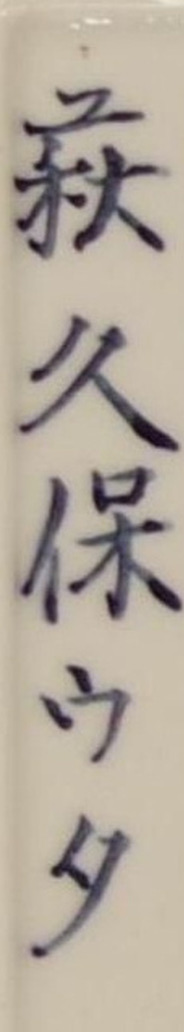萩久保ウタ

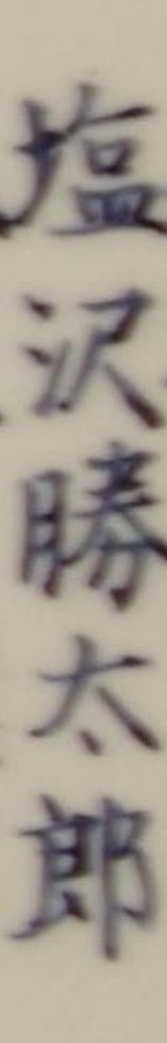塩沢勝太郎
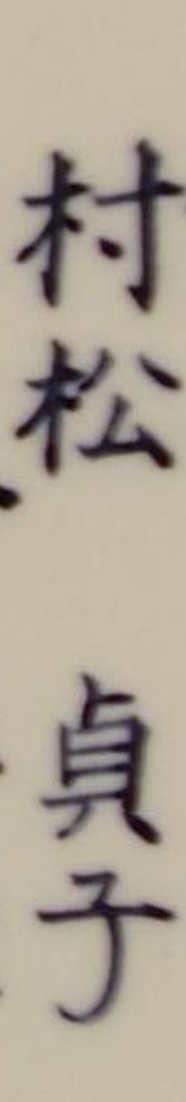村松貞子
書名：M~S
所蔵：高野山金剛峯寺
